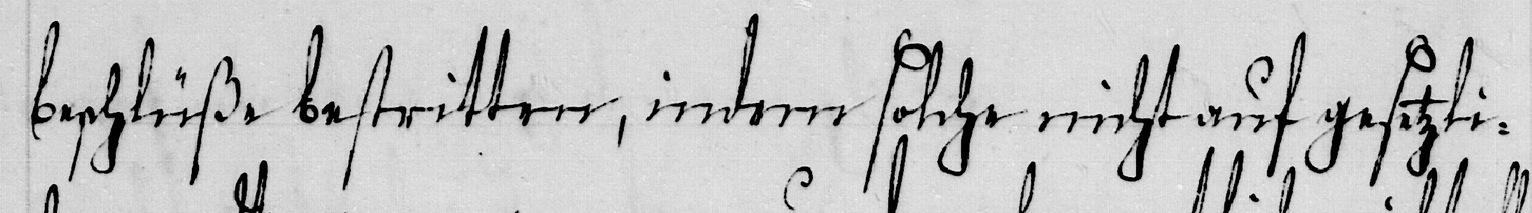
beschlüße bestritten, indem solche nicht auf gesetzli¬
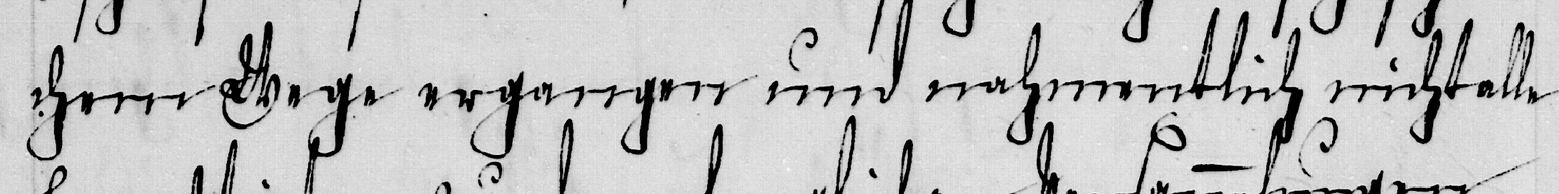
chem Wege ergangen und nahmentlich nicht alle
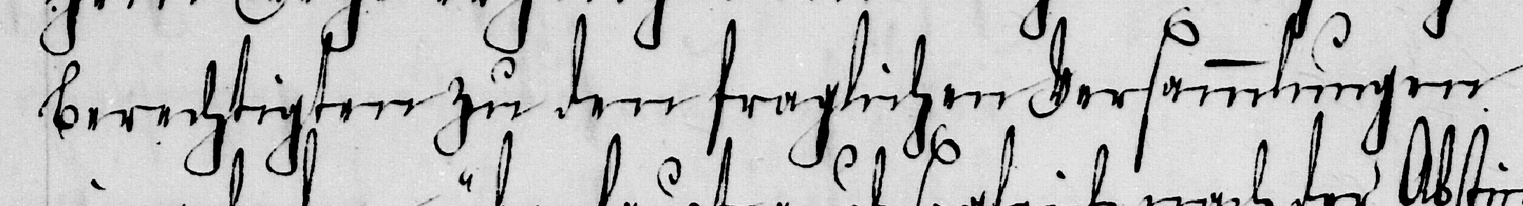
Berechtigten zu den fraglichen Versammlungen
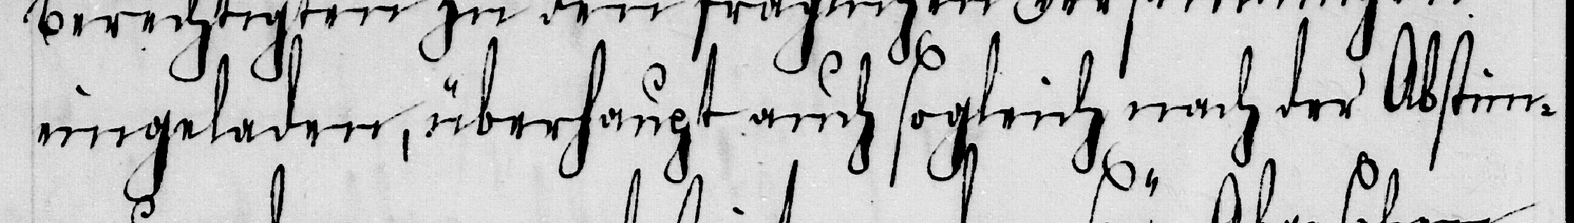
eingeladen, überhaupt auch sogleich nach der Abstim¬
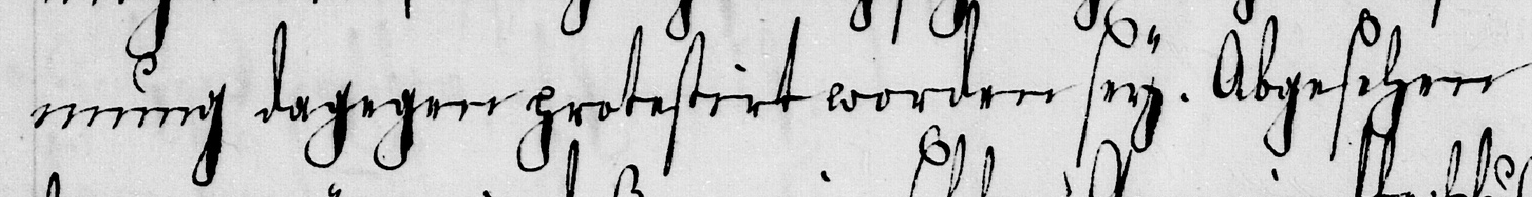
mung dagegen protestirt worden sey. Abgesehen
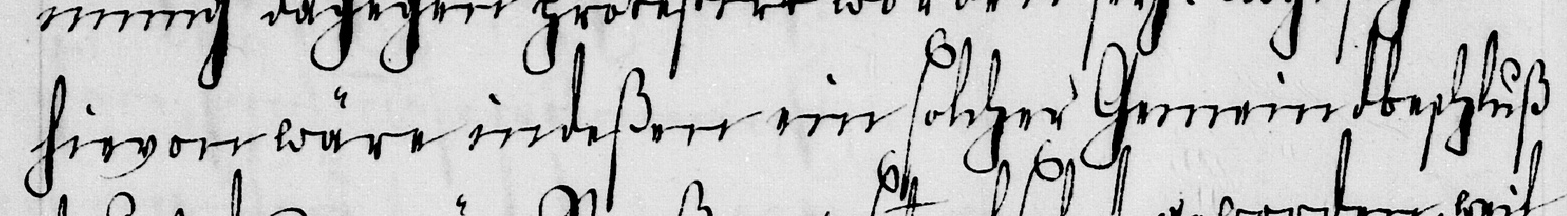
hievon wäre indeßen ein solcher Gemeindbeschluß
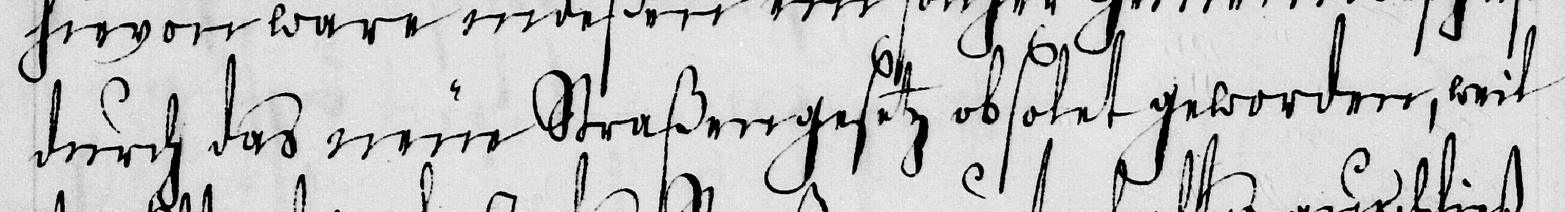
durch das neue Straßengesetz obsolet geworden, weil
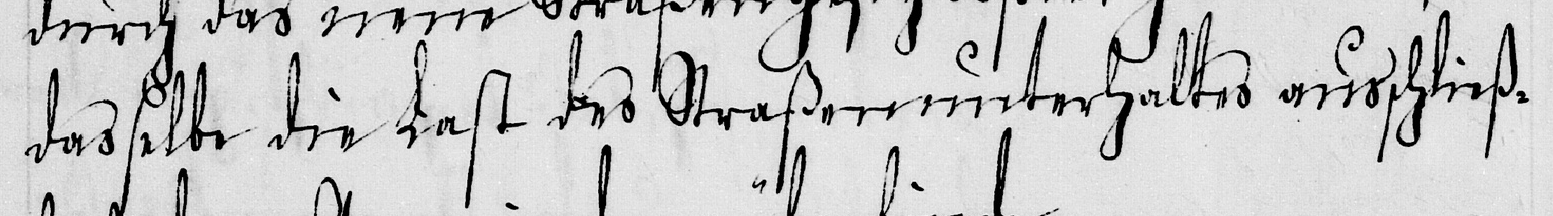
dasselbe die Last des Straßenunterhaltes ausschließ¬
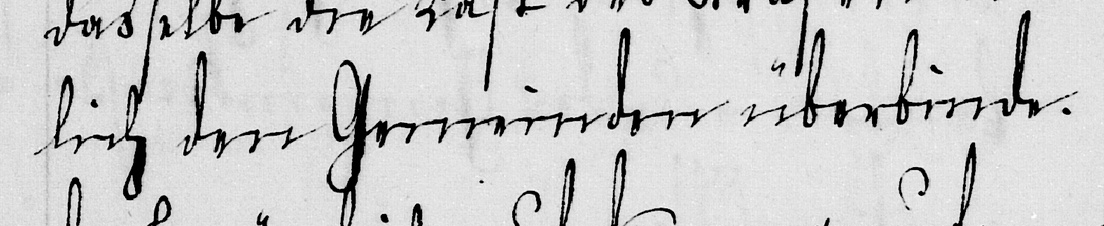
lich den Gemeinden überbinde.
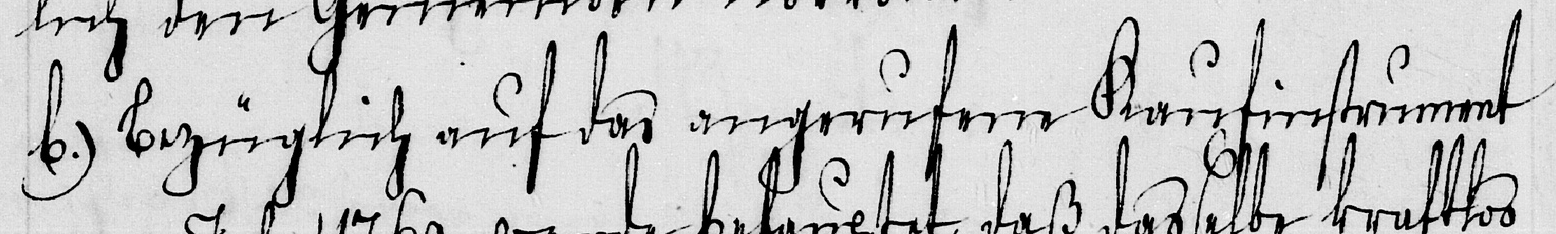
b.) bezüglich auf das angerufene Kaufinstrument
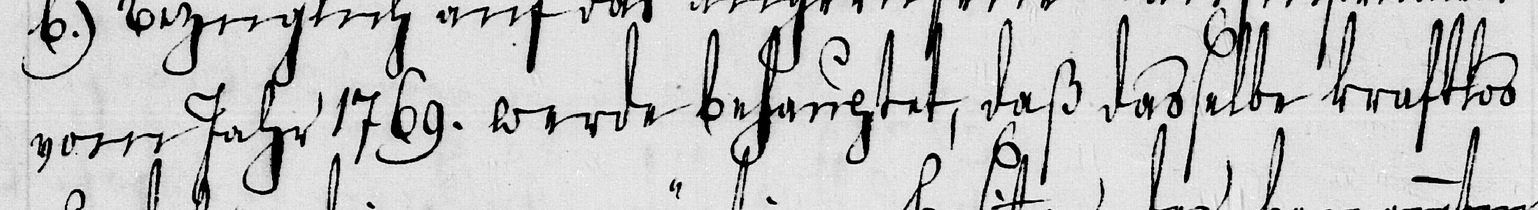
vom Jahr 1769. werde behauptet, daß dasselbe kraftlos
